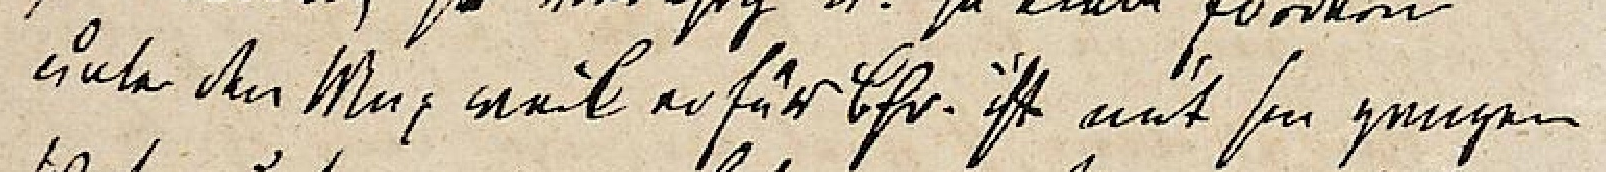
unter den Mn, weil er für Chr. ist mit sm ganzen
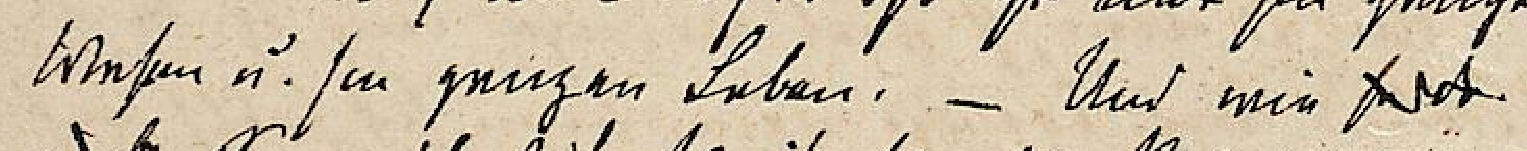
Wesen u. sm ganzen Leben. _ Und wie so dr.
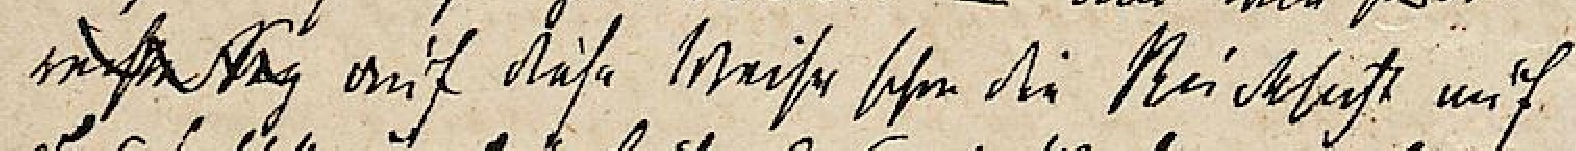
rechte Seg auf diese Weise schon die Rücksicht auf
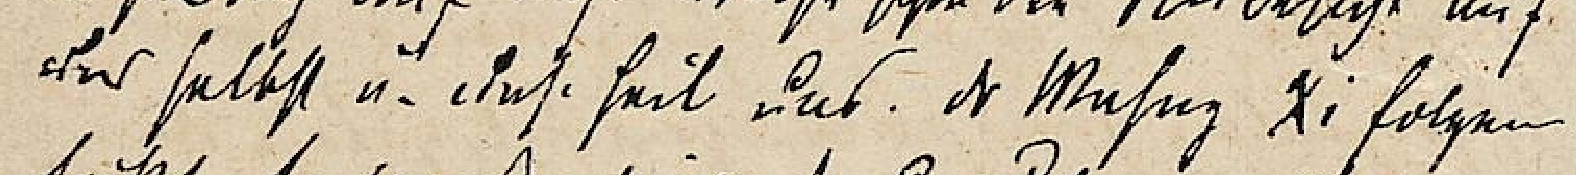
uns selbst u. uns. Heil uns. dr Mahng Χι folgen
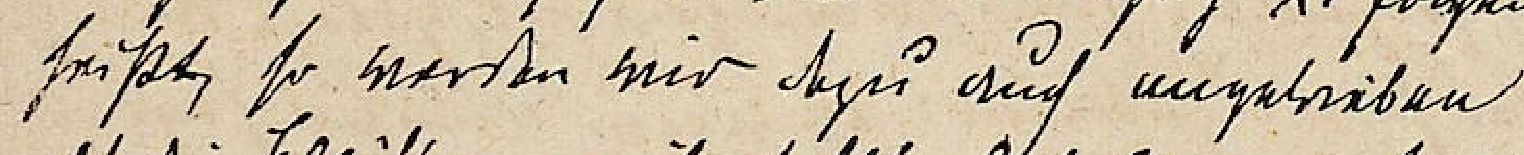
heißt, so werden wir dazu auch angetrieben
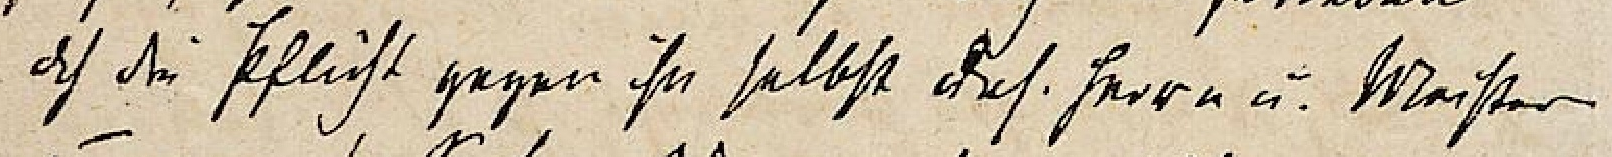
dch die Pflicht gegen ihn selbst uns. Herrn u. Meister
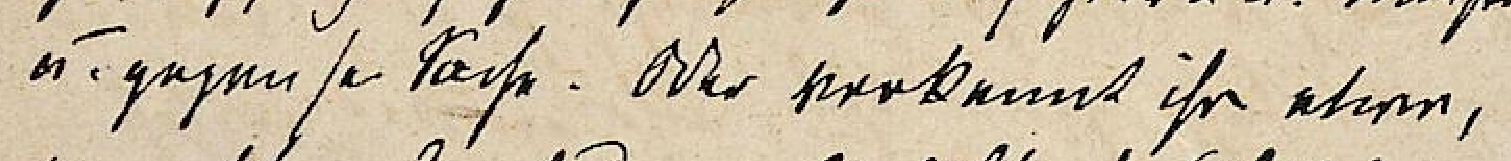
u. gegen sn Sache. Wer verkennt ihr etwa,
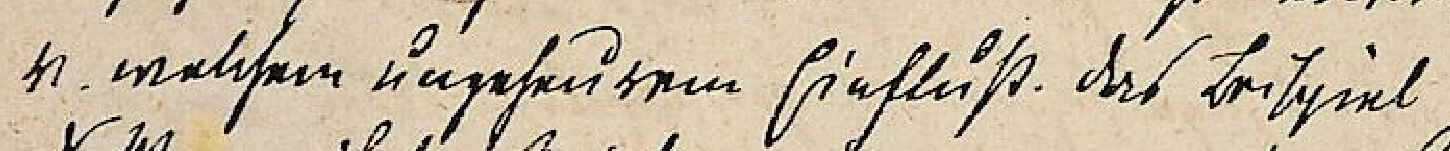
v. welchem ungeheuren Einfluß das Beispiel
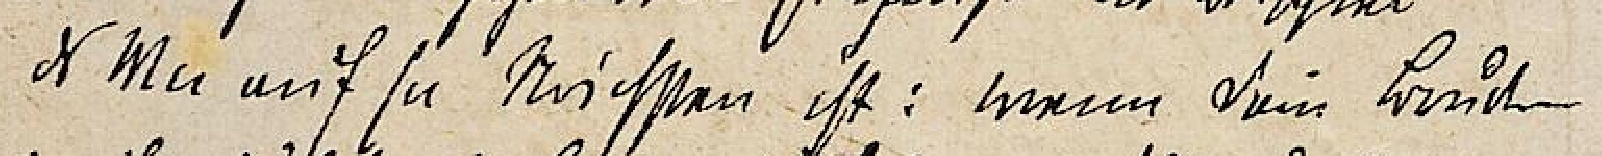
ds Mn auf sn Nächsten ist: wenn dein Bruder
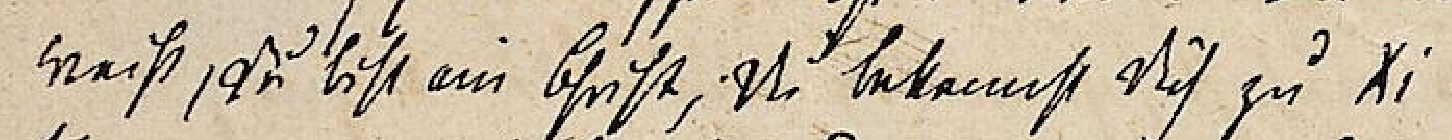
weiß, du bist ein Christ; Du bekennst Dich zu Χι
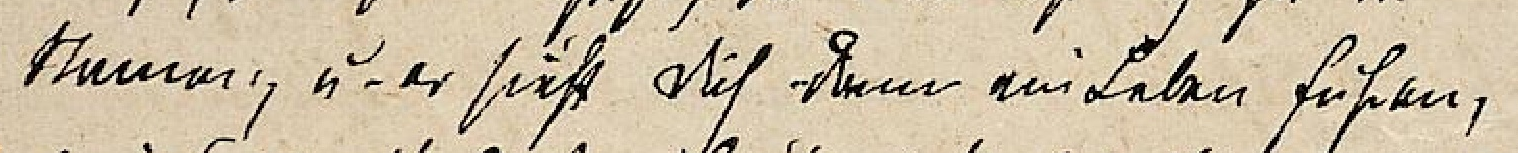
Namen, u. er sieht Dich dann ein Leben führen,
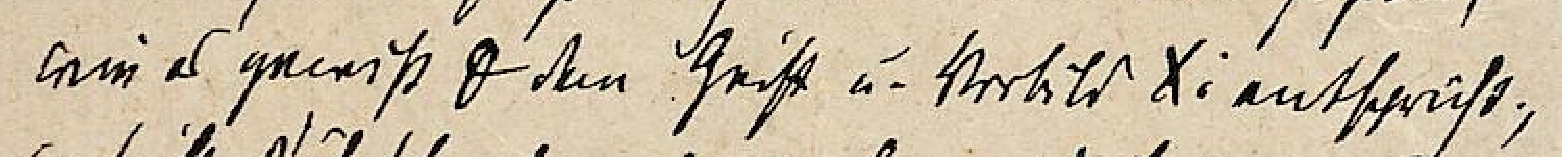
wie es gewiß o dem Geist u. Vorbild Χι entspricht,
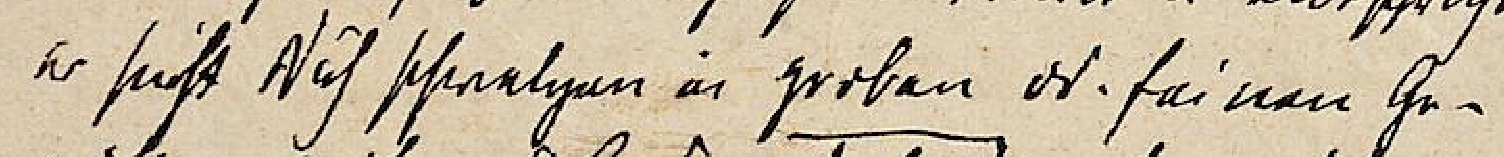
er sieht Dich schwelgen in groben od. feinen Ge¬
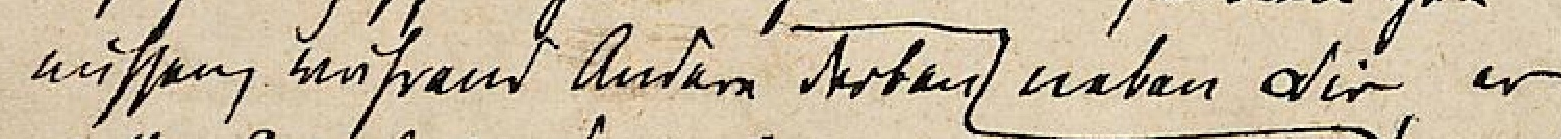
nüssen, während Andere darben neben Dir, er
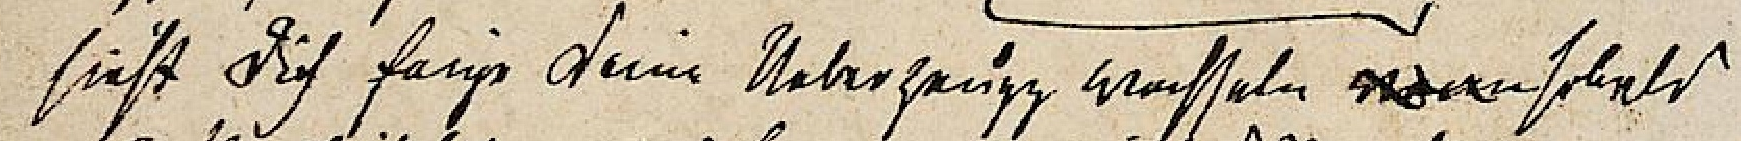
sieht Dich feige Deine Ueberzeugg. wechseln wenn sobald
